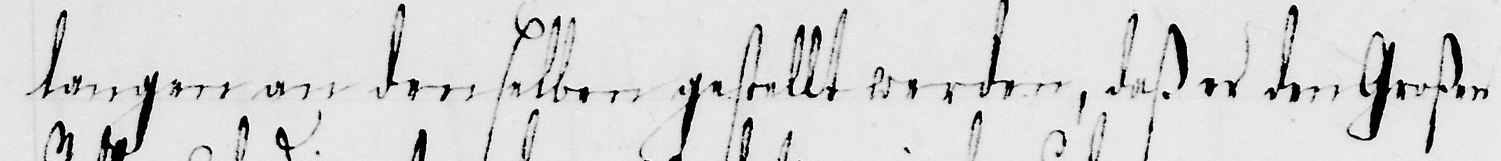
langen an denselben gestellt werden, daß er den Großen
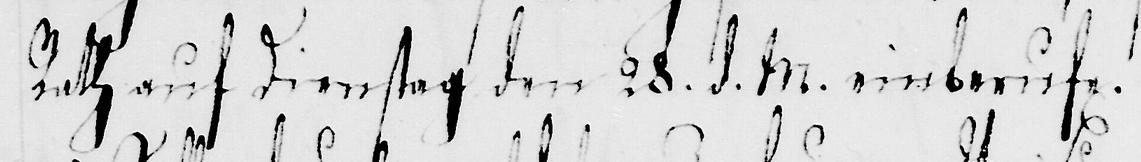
Rath auf Dienstag den 28 d. M. einberufe.
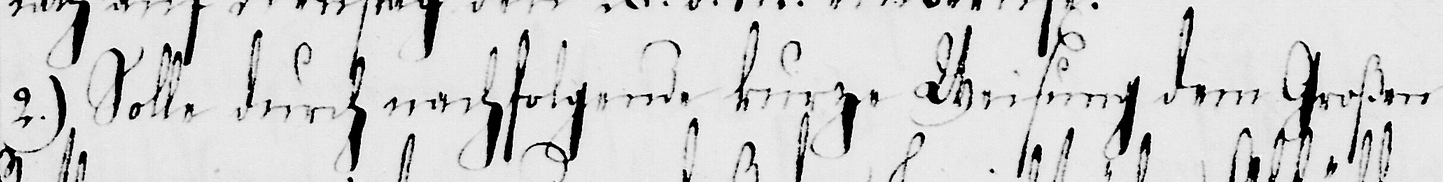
2.) Solle durch nachfolgende kurze Weisung dem Großen
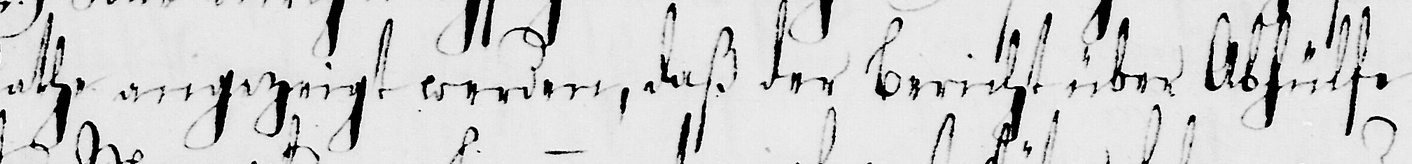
Rathe angezeigt werden, daß der Bericht über Abhülfe
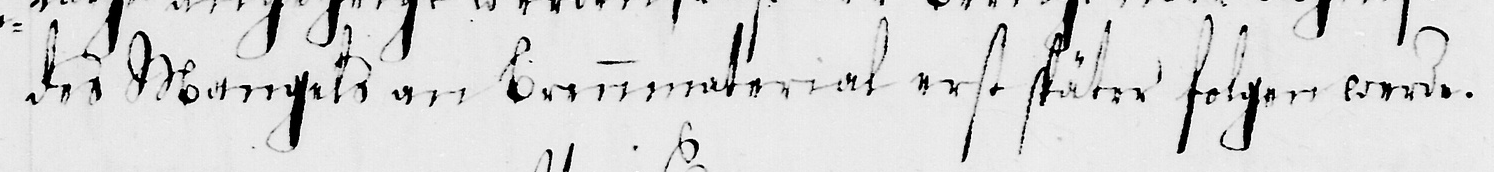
des Mangels an Brennmaterial erst später folgen werde.
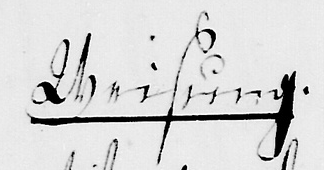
Weisung.
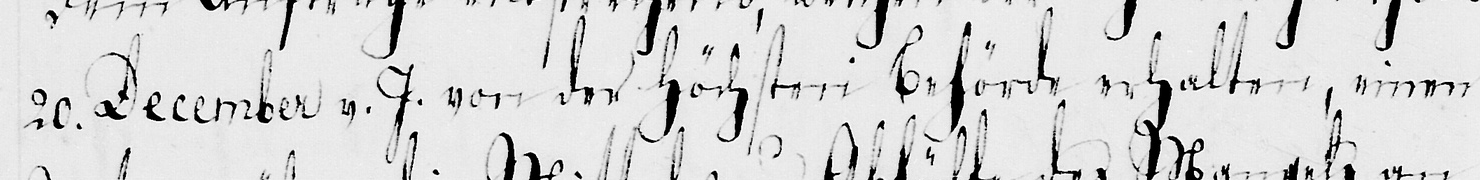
20. December v. J. von der Höchsten Behörde erhalten, einen
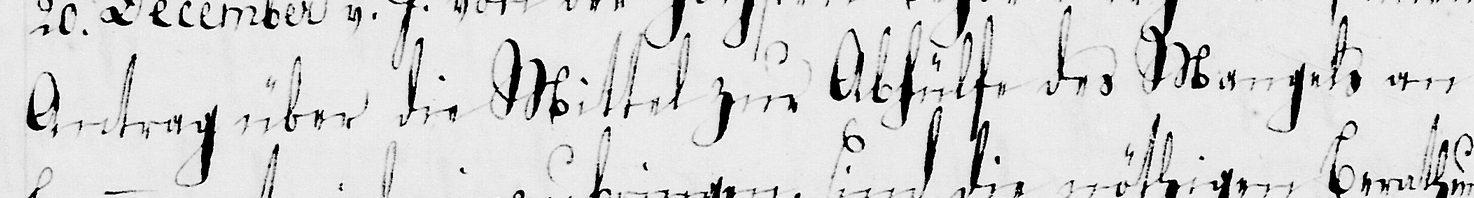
Antrag über die Mittel zur Abhülfe des Mangels an
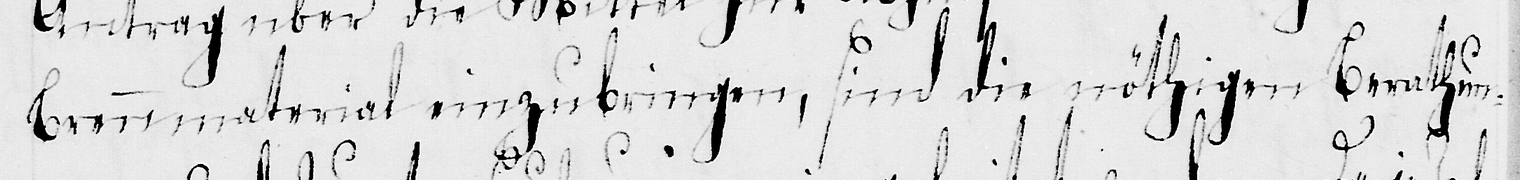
Brennmaterial einzubringen, sind die nöthigen Berathun¬
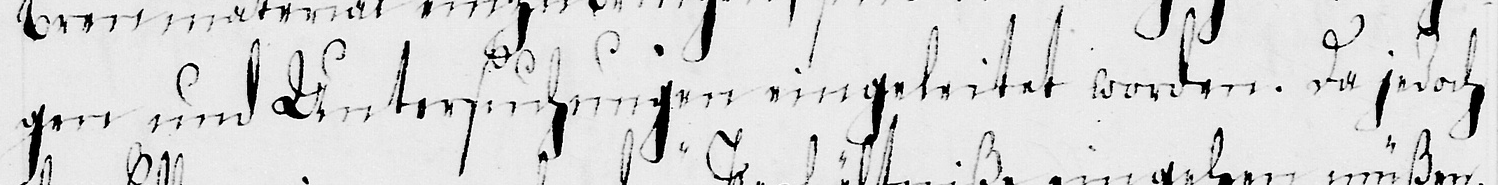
gen und Untersuchungen eingeleitet worden. Da jedoch
